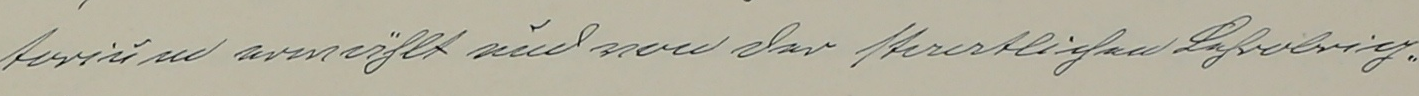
torium erwählt und von der staatlichen Lehrobrig-
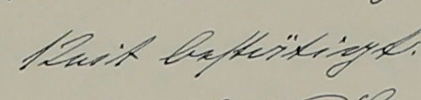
keit bestätigt.
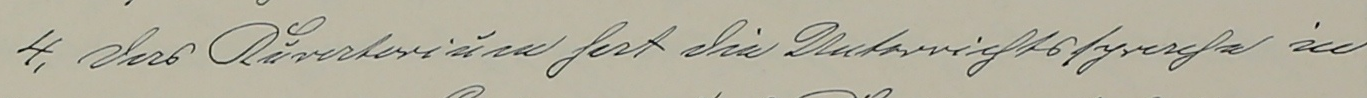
4. Das Kuratorium hat die Unterrichtssprache in
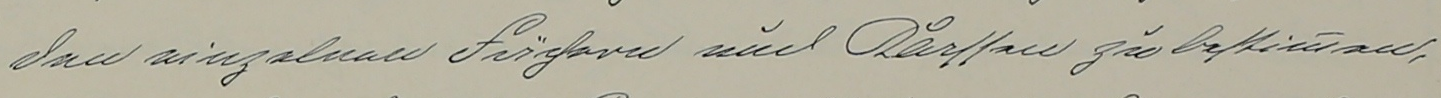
den einzelnen Fächern und Klassen zu bestimmen,
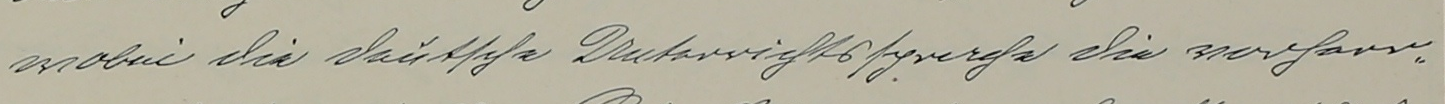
wobei die deutsche Unterrichtssprache die vorherr-
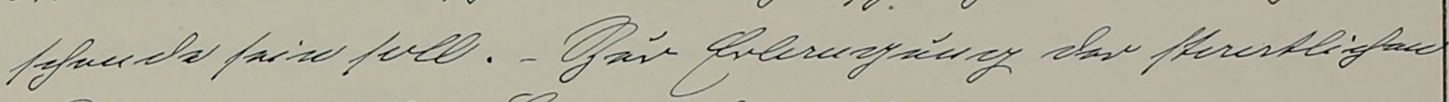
schende sein soll. - Zur Erlangung der staatlichen
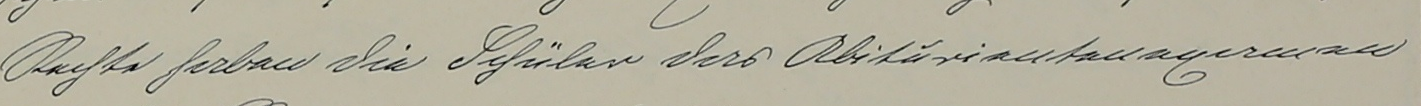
Rechte haben die Schüler das Abiturientenexamen
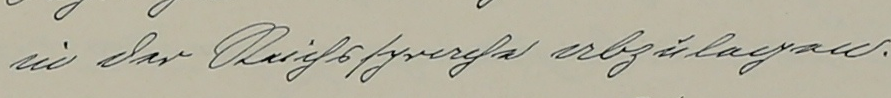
in der Reichssprache abzulegen.
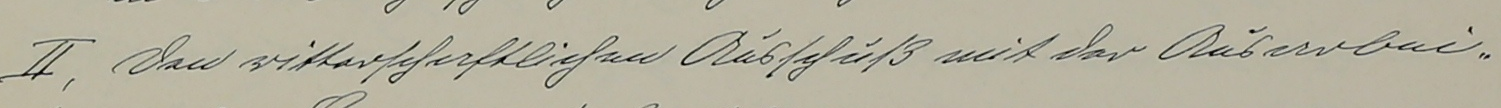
II. Den ritterschaftlichen Ausschuß mit der Ausarbei-
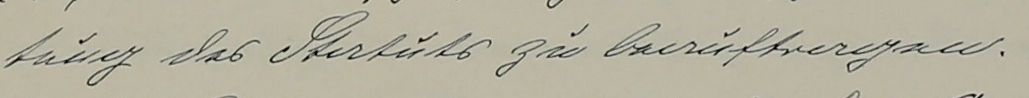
tung des Statuts zu beauftragen.
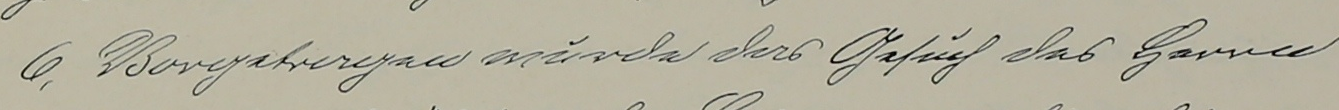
6. Vorgetragen wurde das Gesuch des Herrn
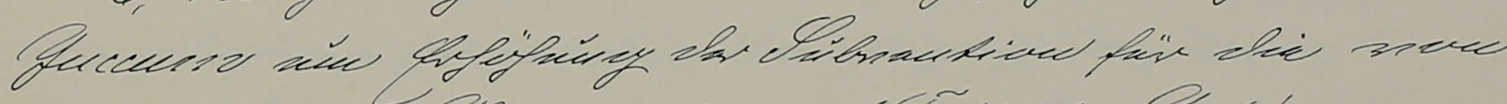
Juccum um Erhöhung der Subvention für die von
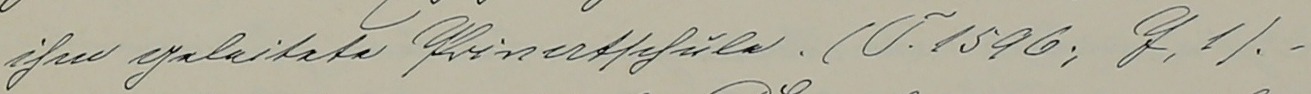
ihm geleitete Privatschule. (T.1596; J.1).
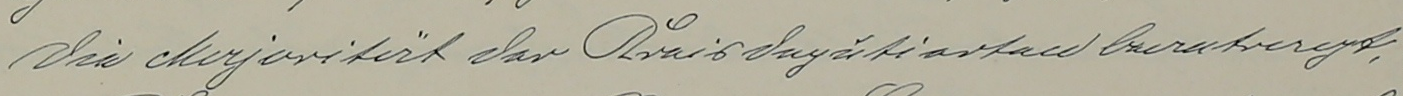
Die Majorität der Kreisdeputierten beantragt,
